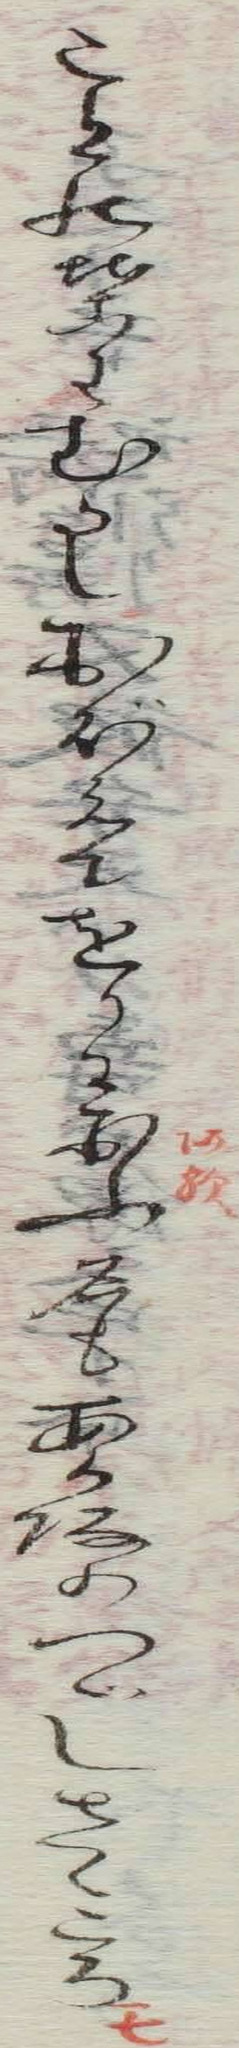ことの葉にむかしおぼえてをりにおふ名もあか坂のつゞしさくころモ
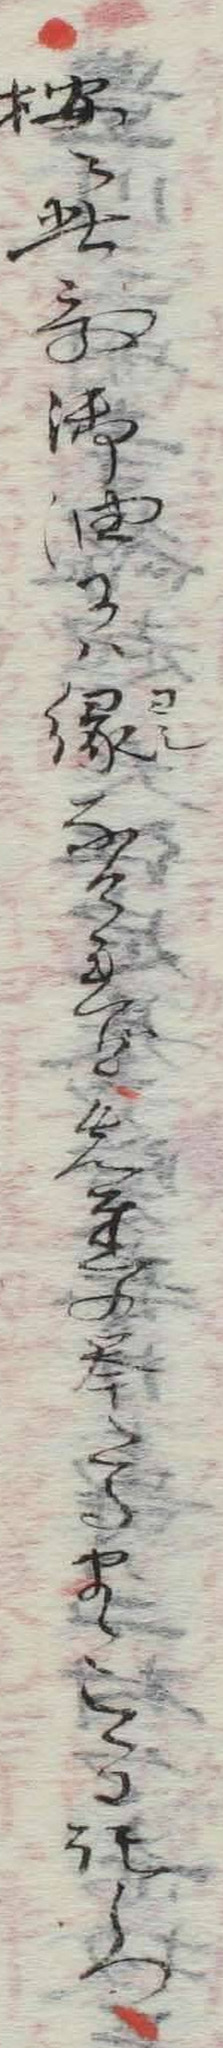●按ニ此歌御油には縁なけれど、先達の挙たるまゝこゝに記しつ、
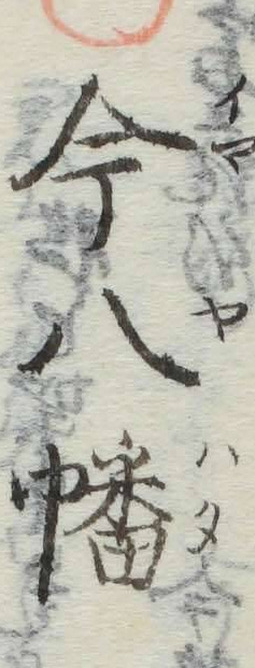○今八幡
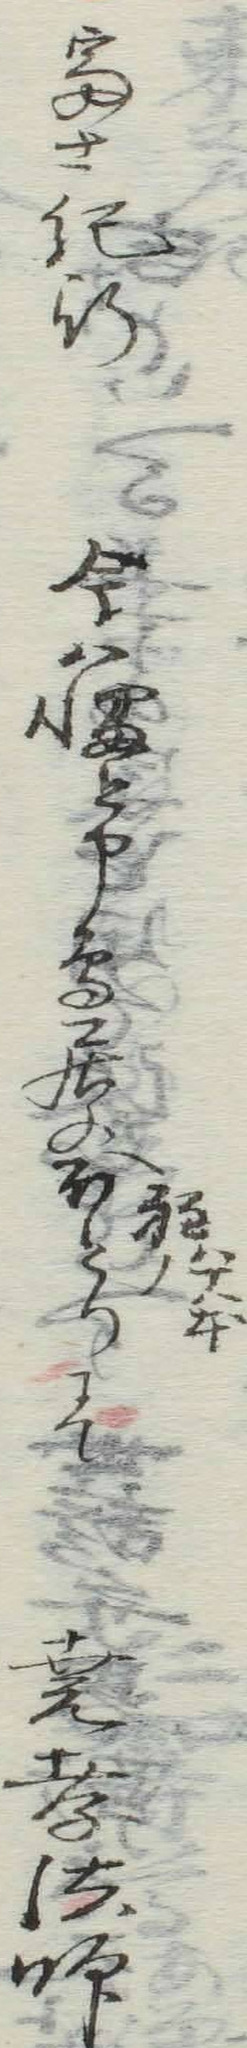●富士紀行今八幡と申鳥居のほとりにて尭孝法師
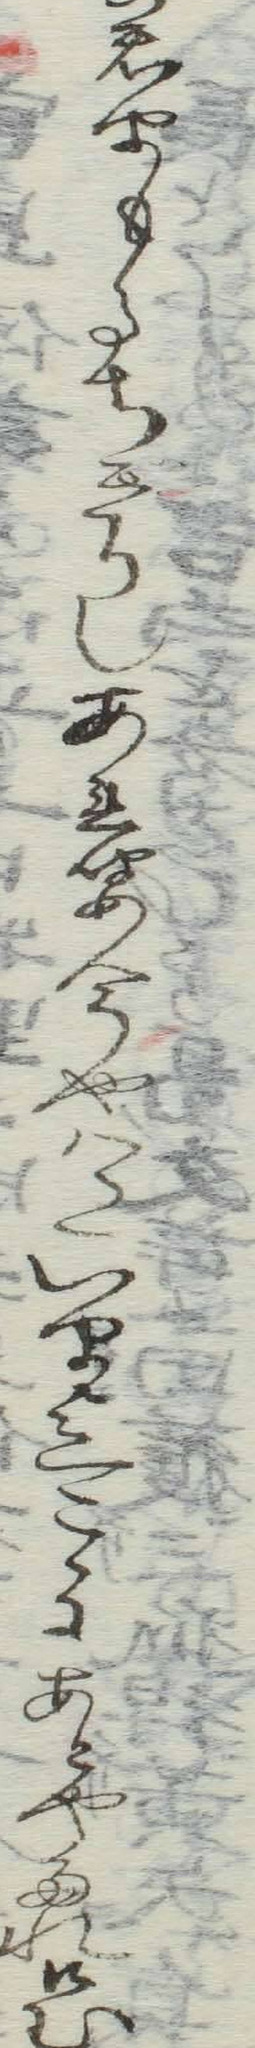君まもるちぎりしあれば今やはたいま迄こゝにあとやたれけむ
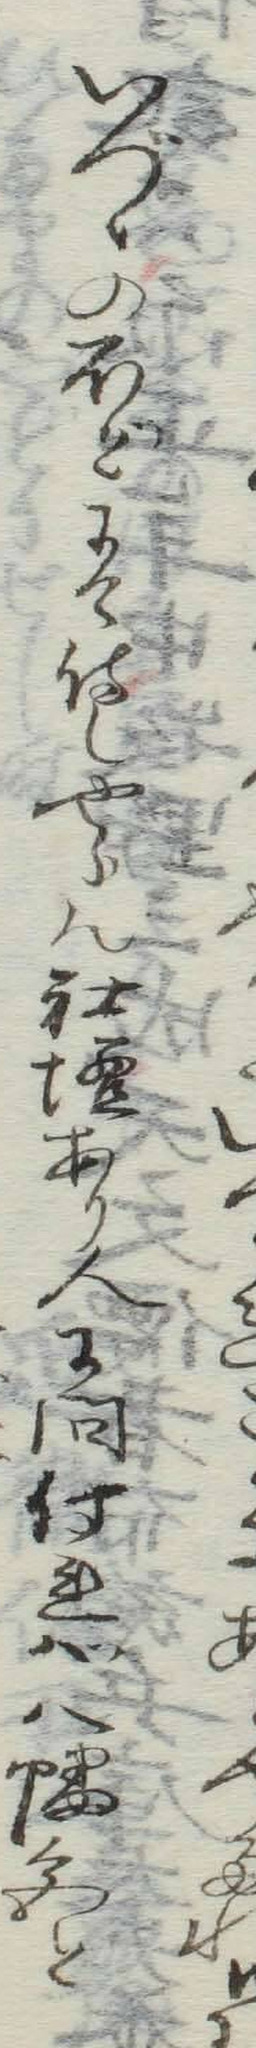いづくのほどにて侍しやらん社壇あり人に問侍れば八幡宮と
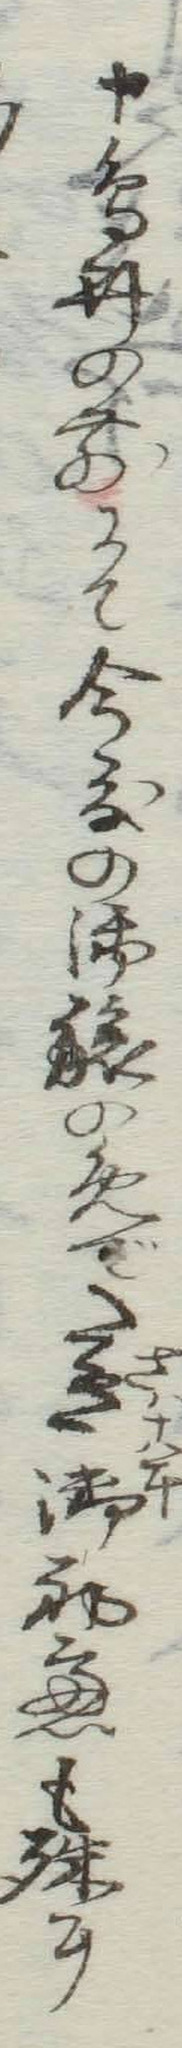申鳥井の前にて今度の御旅のめでたき御神慮も殊に
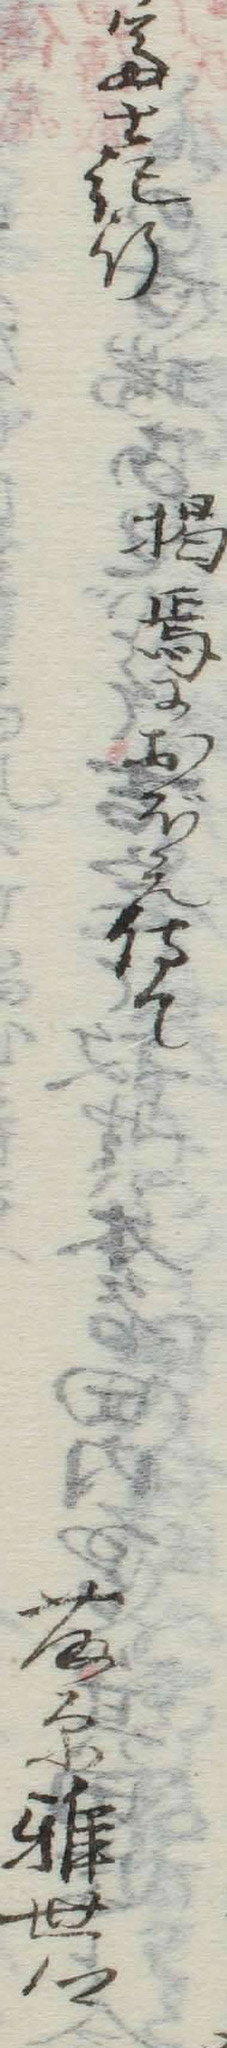●富士紀行掲焉におぼえ侍て藤原雅世卿
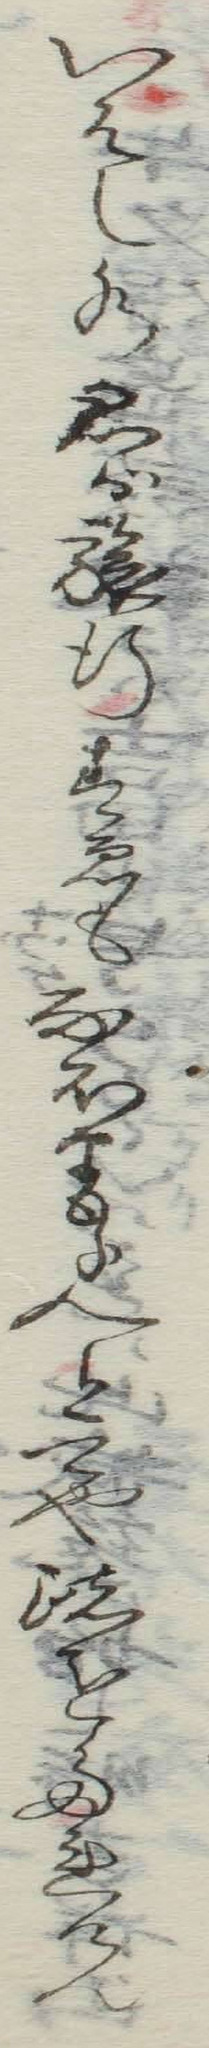いはし水君が旅行すゑもなほまもらんとてや跡をたれけん
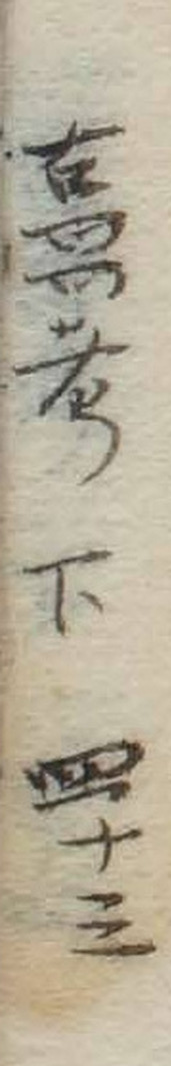古歌考下四十三

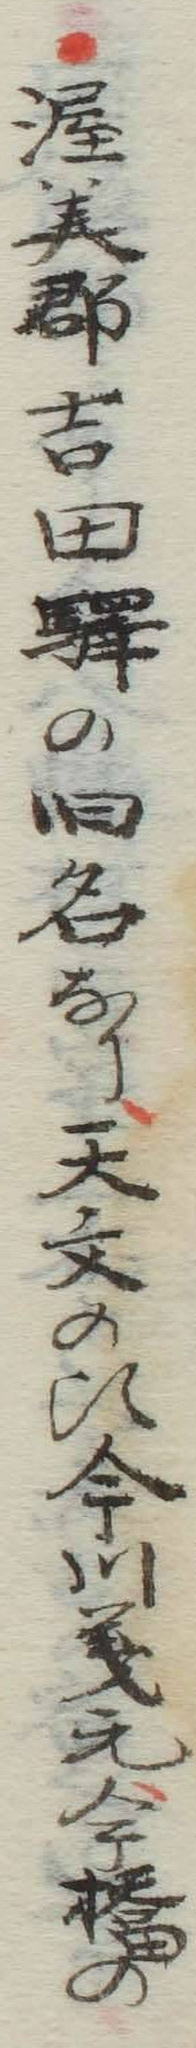○今橋●渥美郡吉田駅の旧名なり、天文の頃今川義元、今橋の
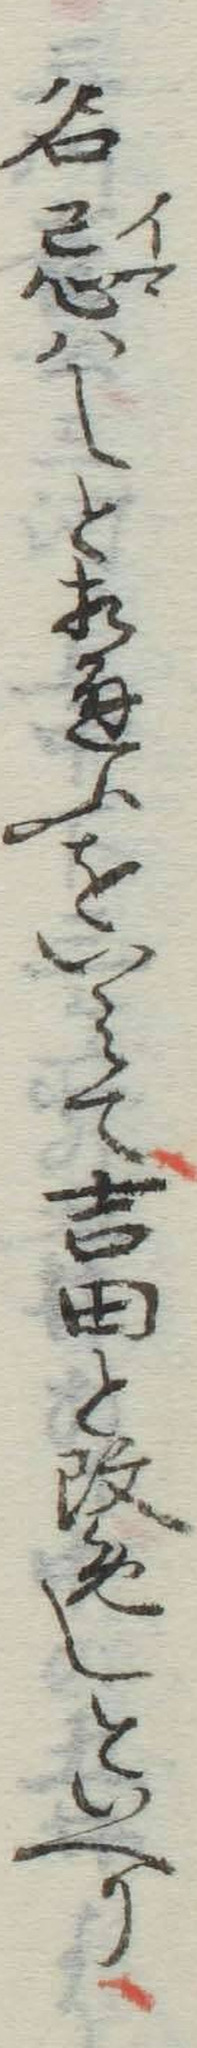名忌はしと相通ふをいみて、吉田と改めしといへり、
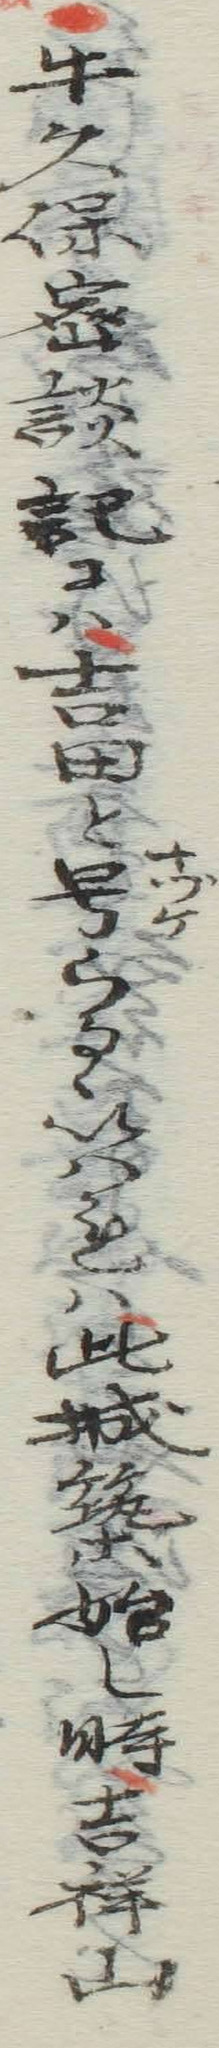●牛久保密談記には、吉田と号らるゝいはれは、此城築始し時、吉祥山
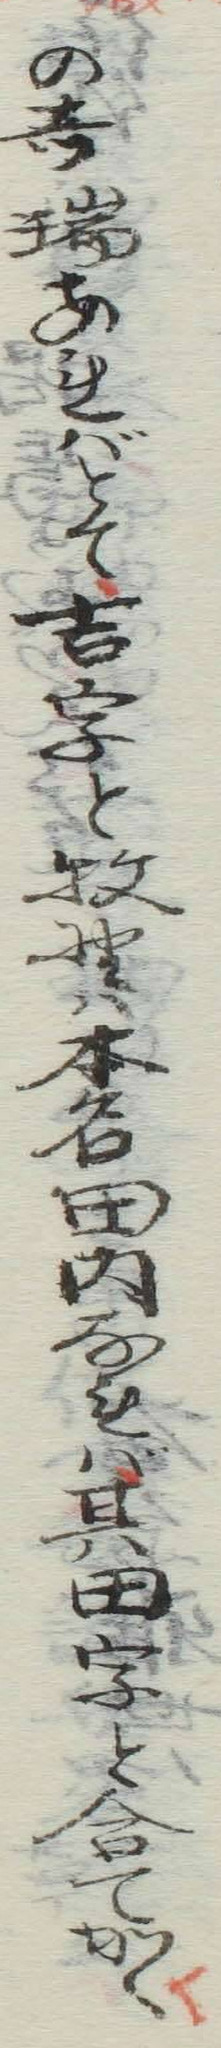の奇瑞あればとて、吉字と牧野は本名田内なれば、其田字と合てかく
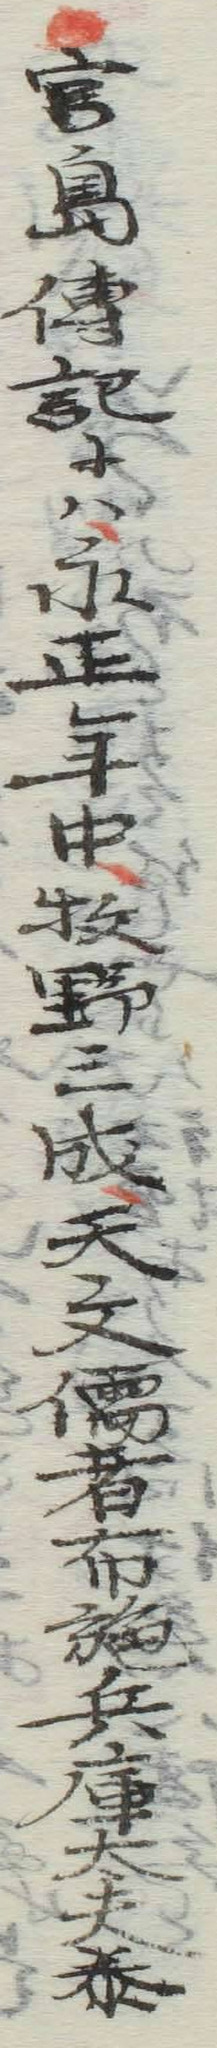●宮島伝記には、永正年中牧野三成、天文儒者布施兵庫太夫泰
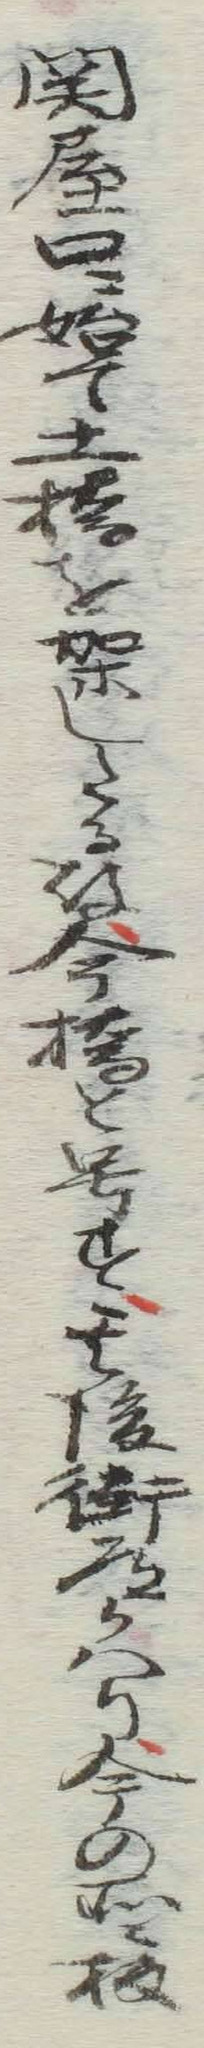関屋口ニ始て土橋を架したる故、今橋と号す、其後街道かはり、今の所ニ板
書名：三河国古跡考
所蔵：国文学研究資料館
